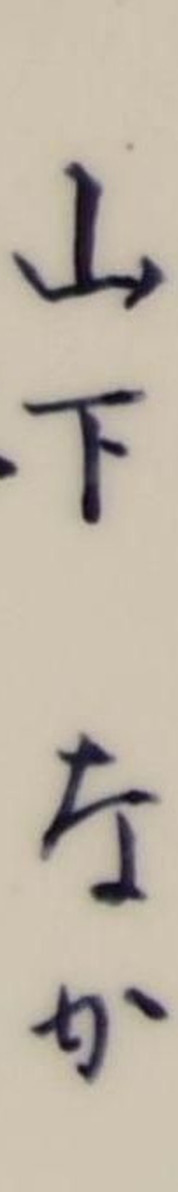山下なか

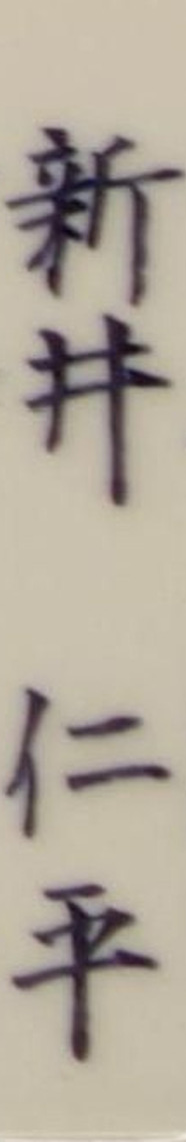新井仁平
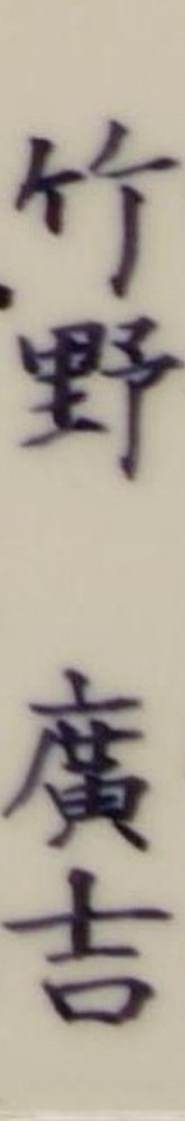竹野廣吉
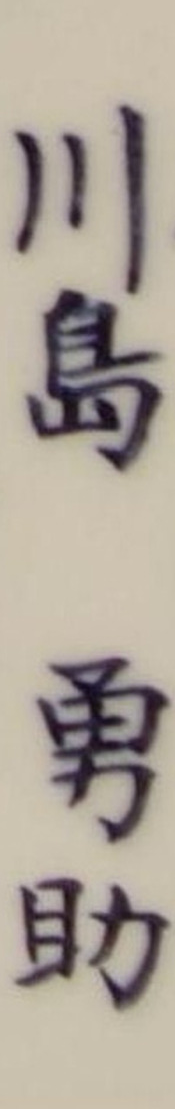川島勇助
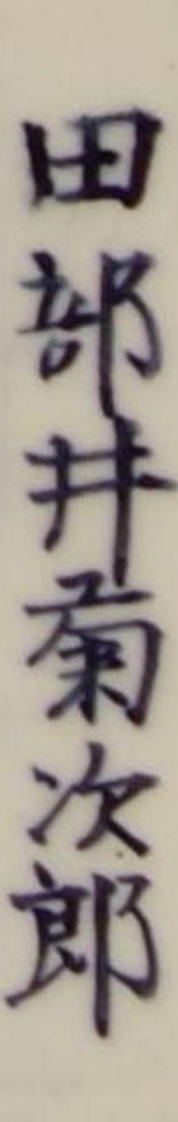田部井菊次郎
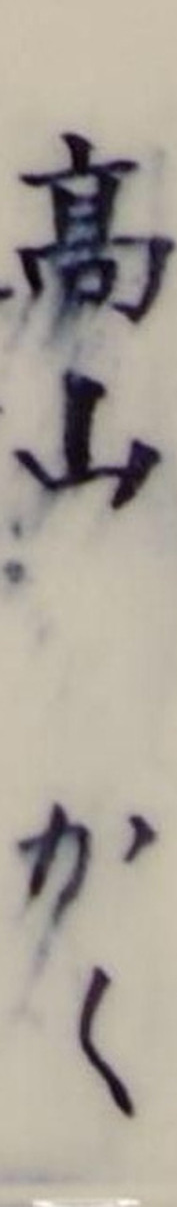高山かく
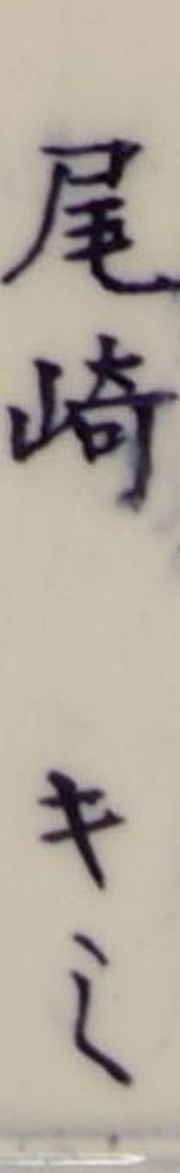尾崎キミ
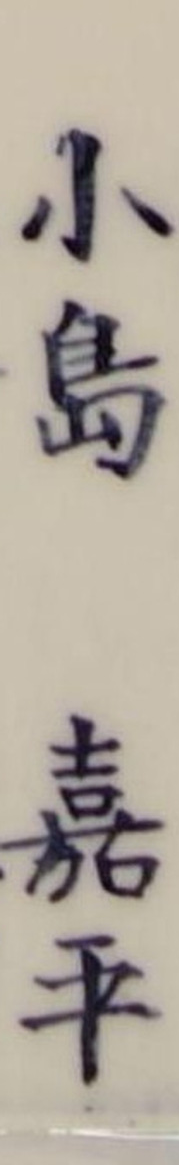小島嘉平
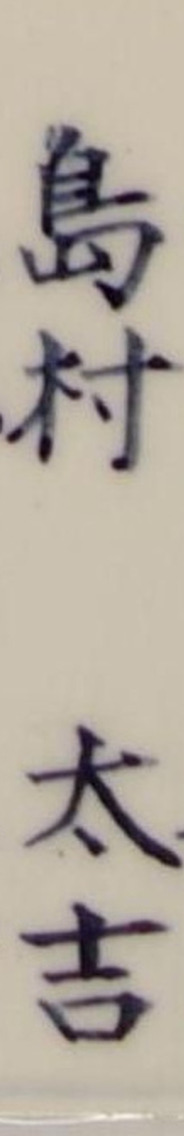島村太吉
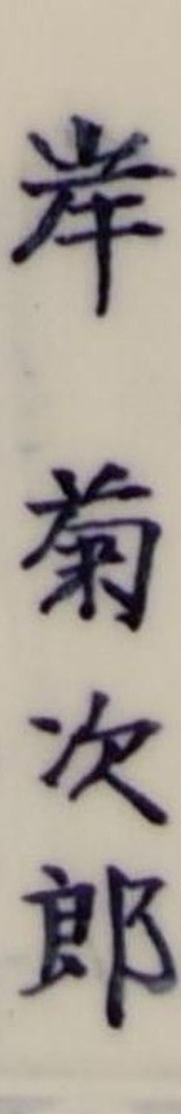岸菊次郎
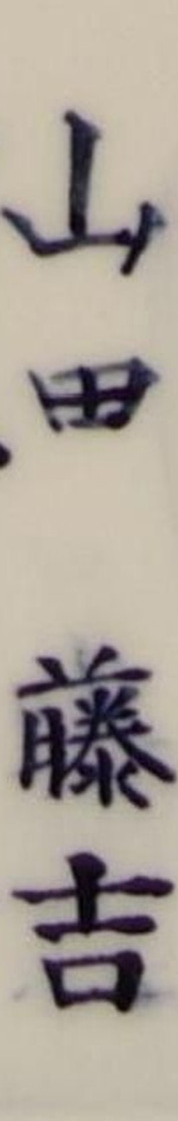山田藤吉
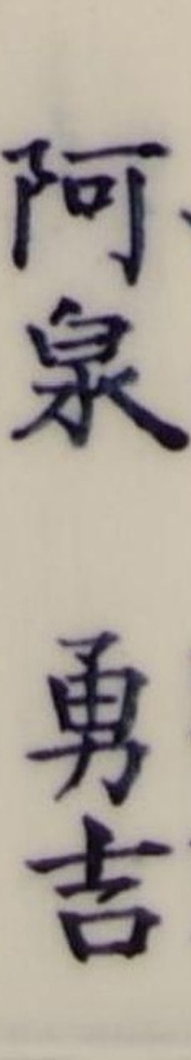阿泉勇吉
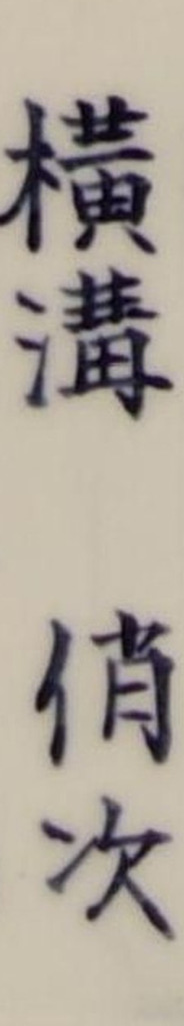横溝俏次
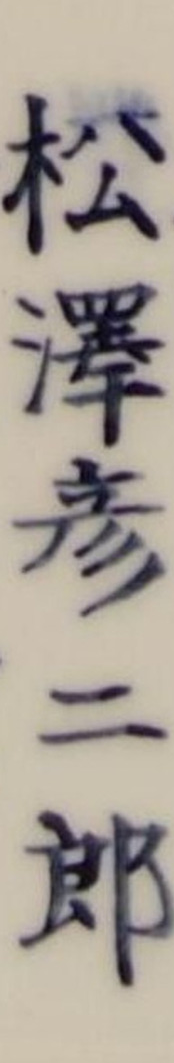松澤彦二郎
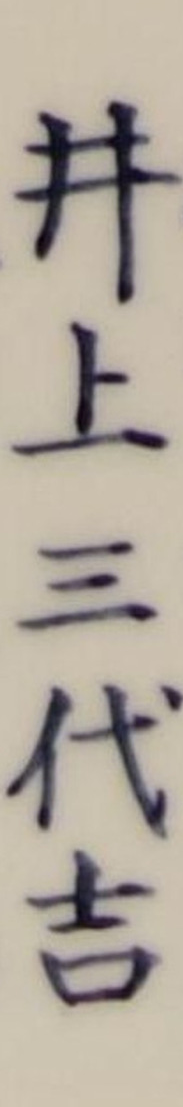井上三代吉
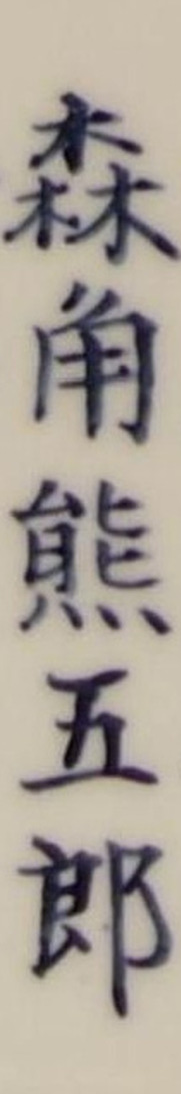森角熊五郎
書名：E~L
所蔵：高野山金剛峯寺
